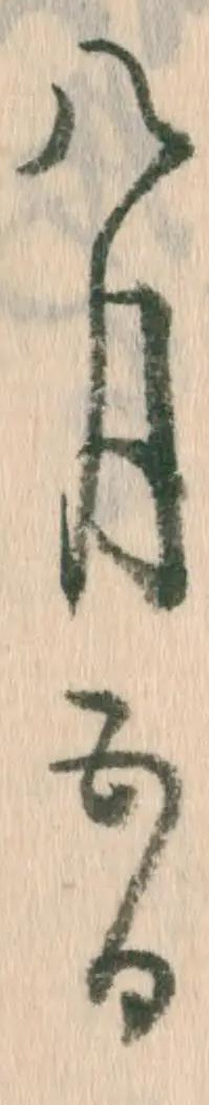八月五日
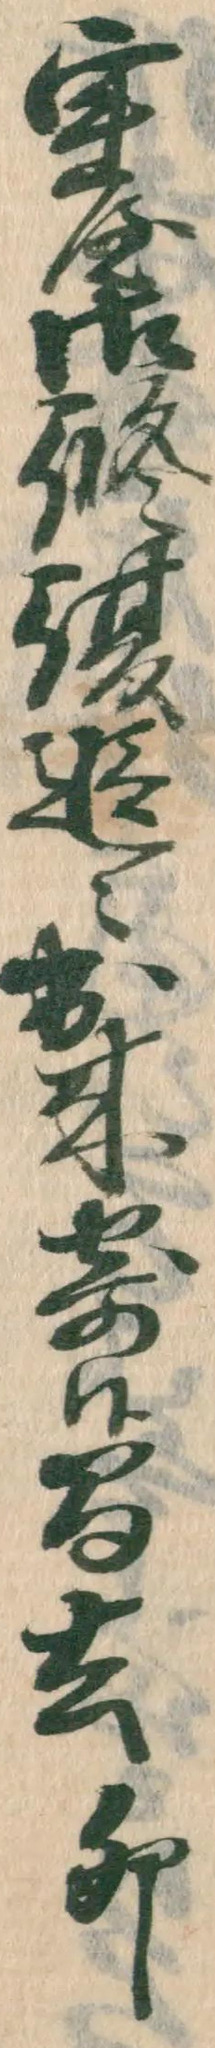牢屋御修復追〻出来寄候間去卯
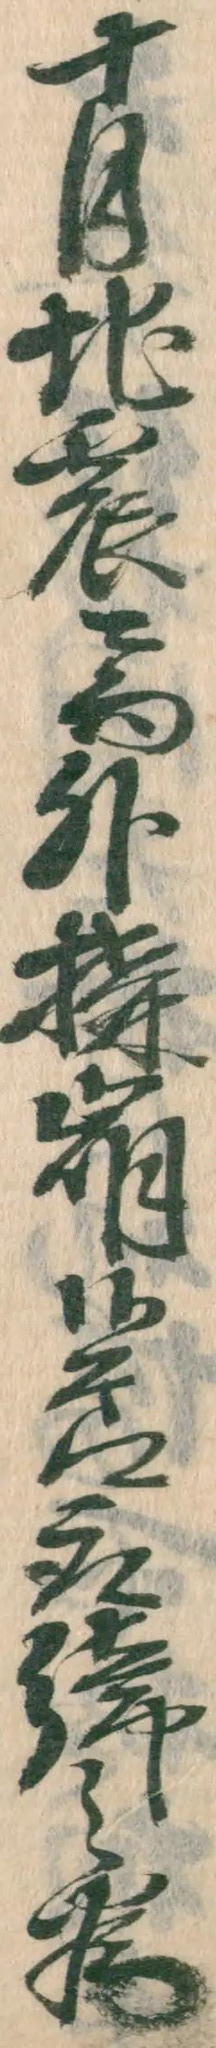十月地震ニて外構崩候節取締之為

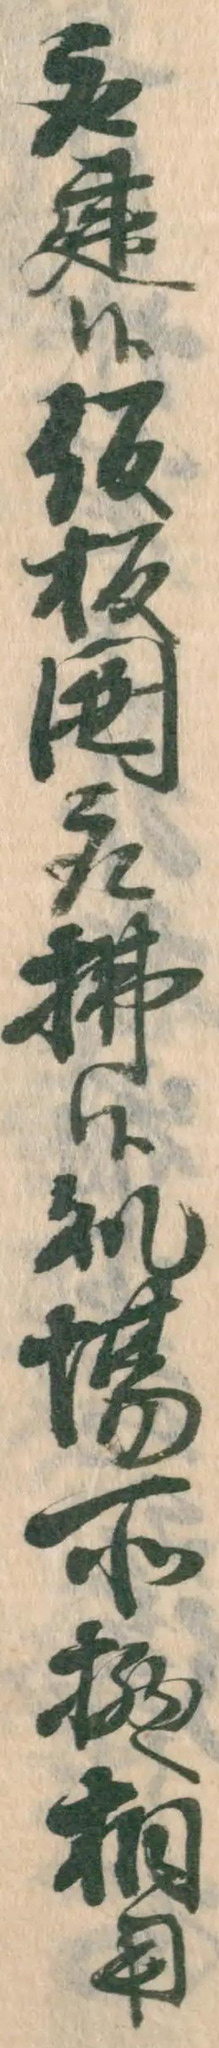取建候仮板囲取払候処場所柄へ相用
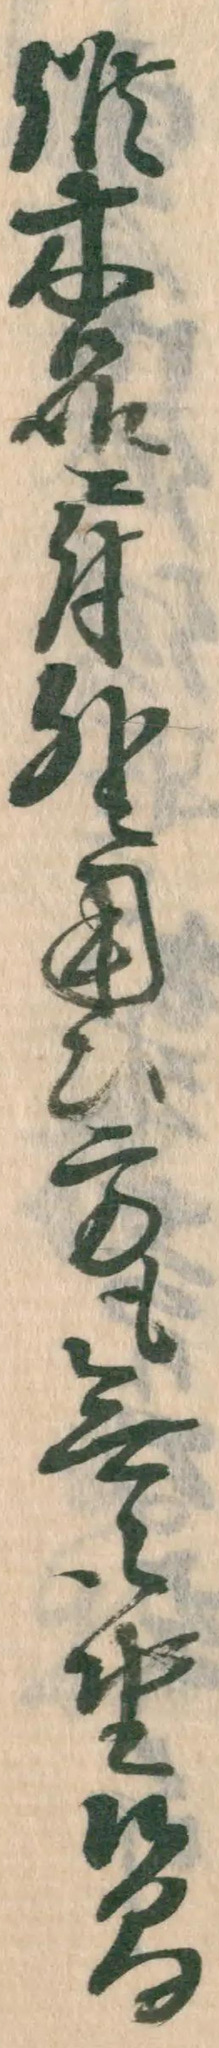候木品ニ付外ニ用ひ方も無御坐候間
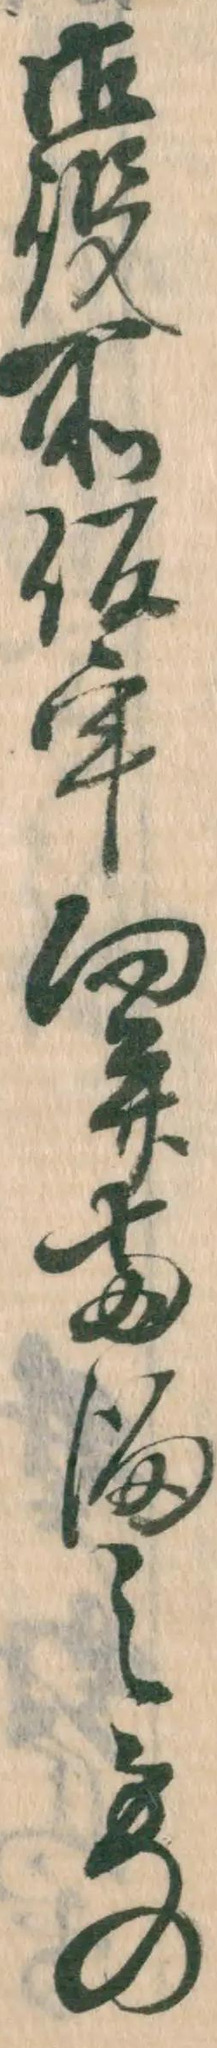此度御役所仮牢向幷両溜のもの
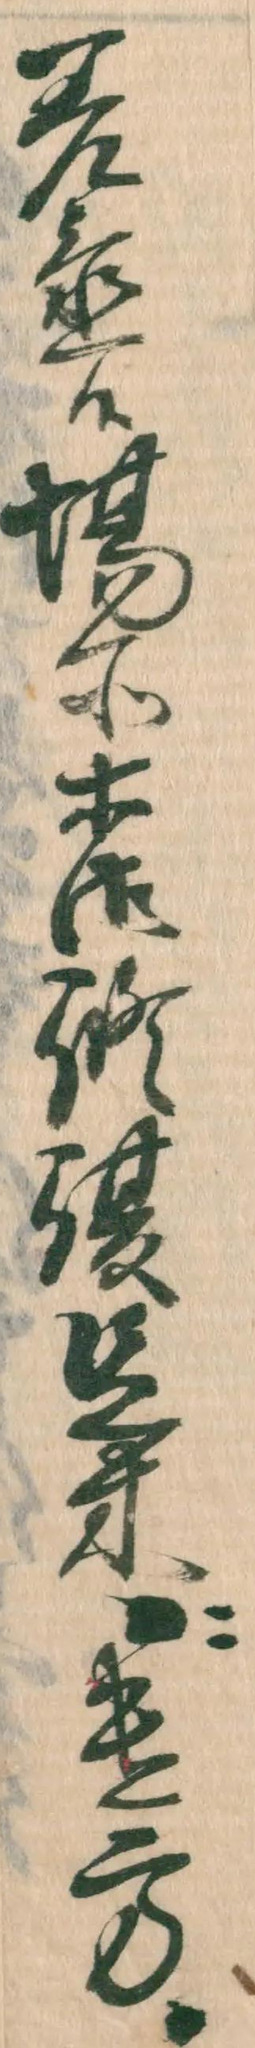差置候場所等御修復足木ニ遣方
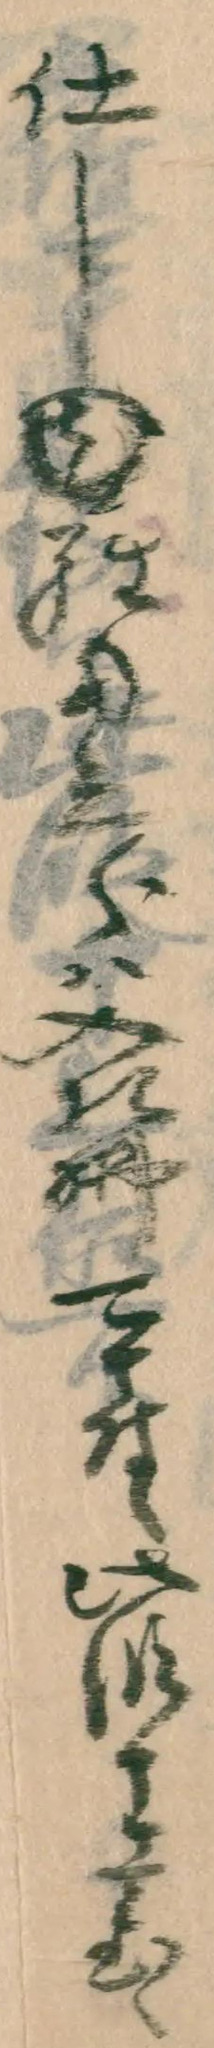仕申尤猶用立分ハ入札払可申付候此段申上置候
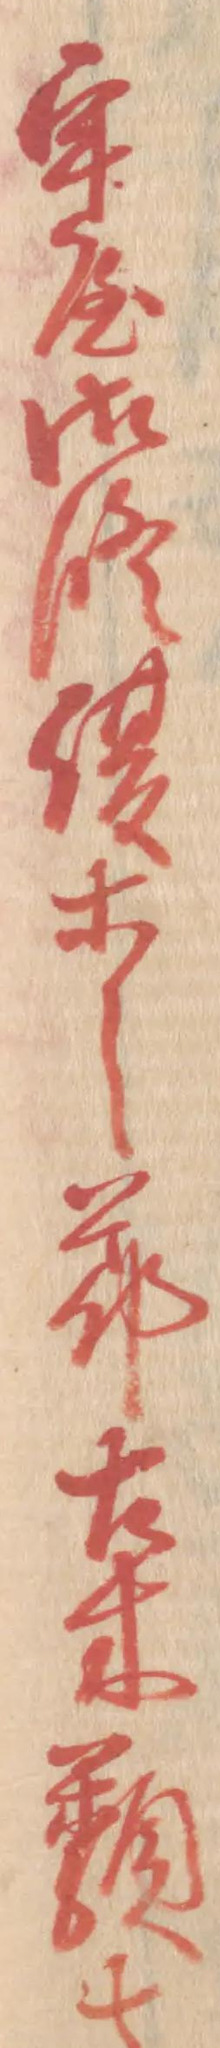「牢屋御修復等之節古木類は
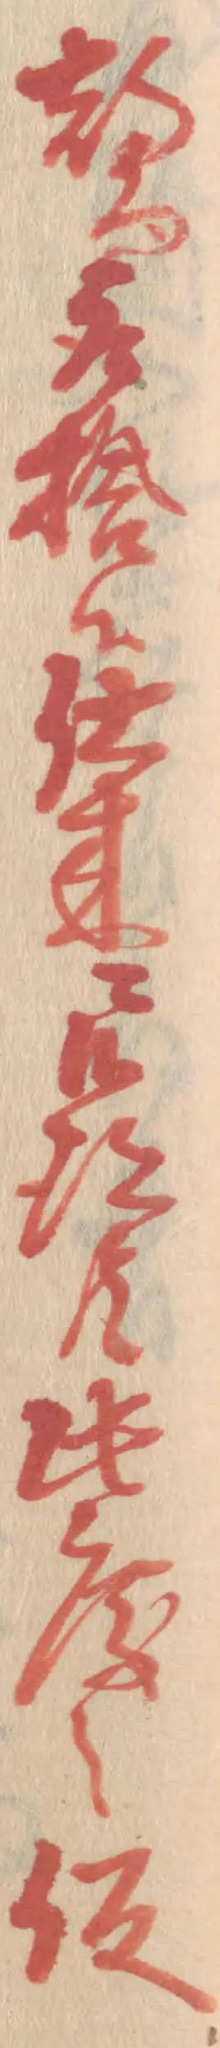都て取捨候仕来ニ候得共此度之仮
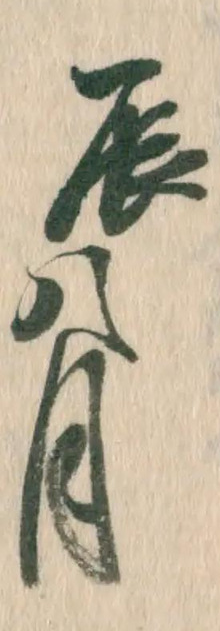辰八月

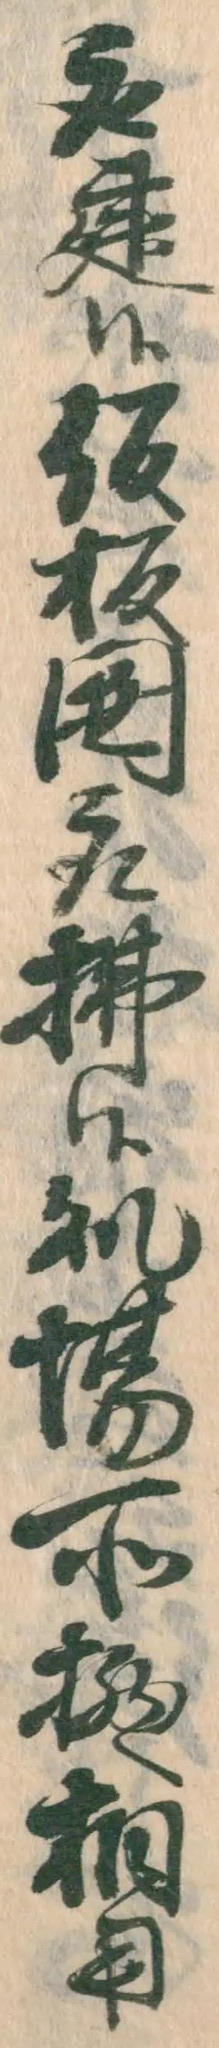取建候仮板囲取払候処場所柄へ相用
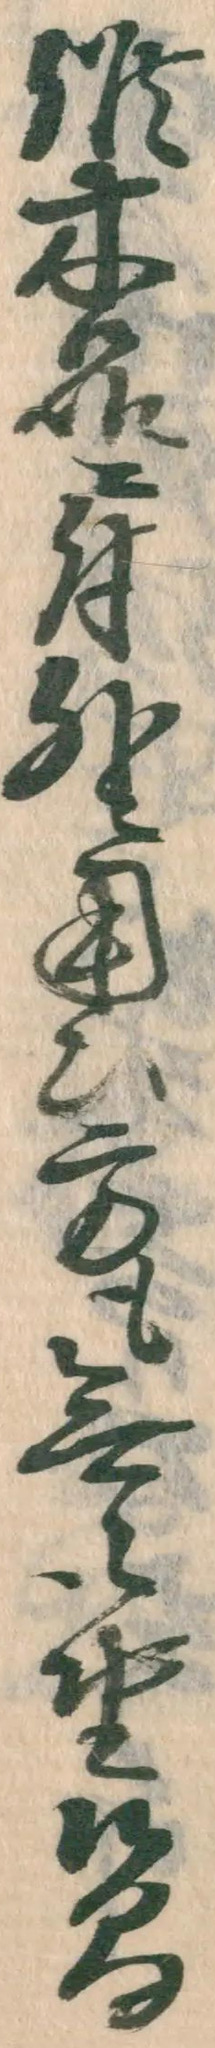候木品ニ付外ニ用ひ方も無御坐候間
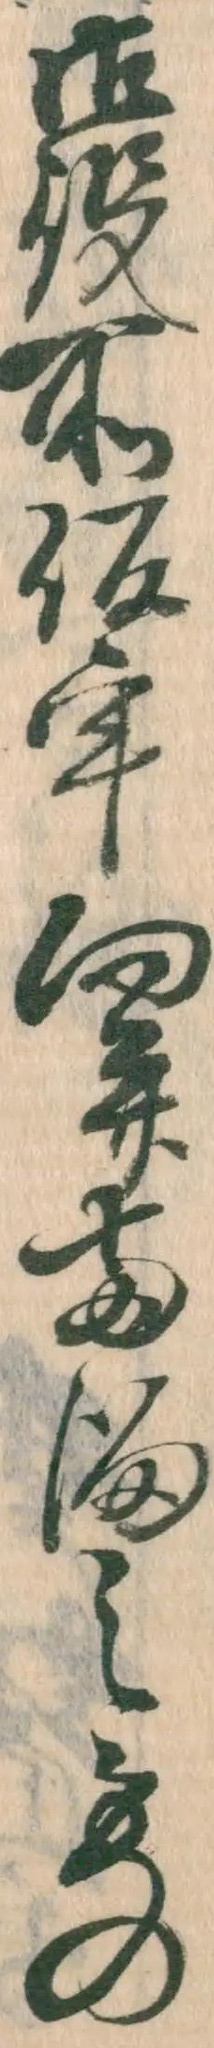此度御役所仮牢向幷両溜のもの
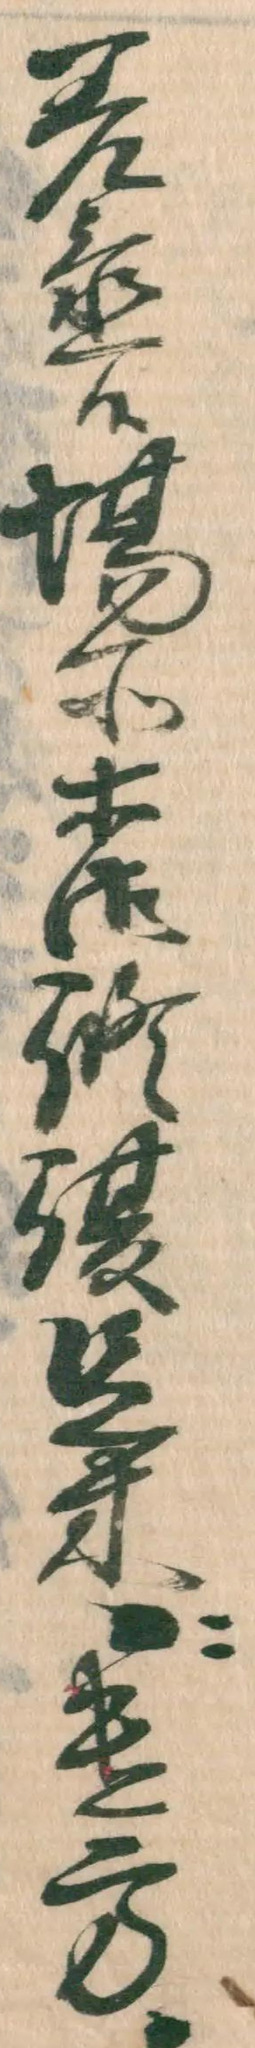差置候場所等御修復足木ニ遣方
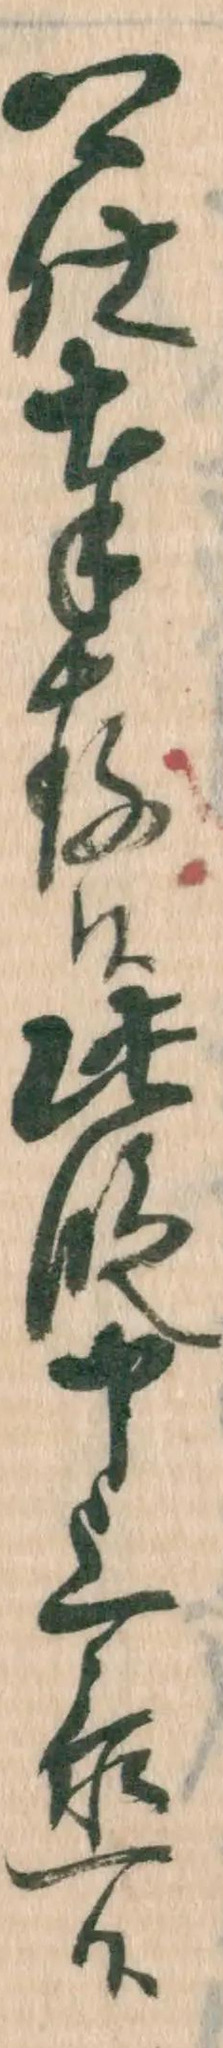可仕奉存候此段申上置候
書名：七十冊物類集 71巻. [44] 四十三 牢屋敷御普請御修覆地震ニ付骨折候牢屋掛御褒美之部
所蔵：国立国会図書館 National Diet Library, JAPAN
